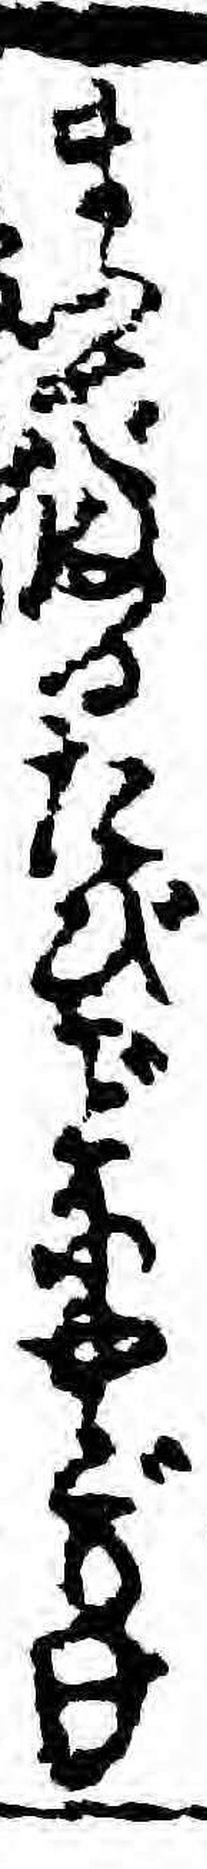まふでぬるたびごとにやどりけ
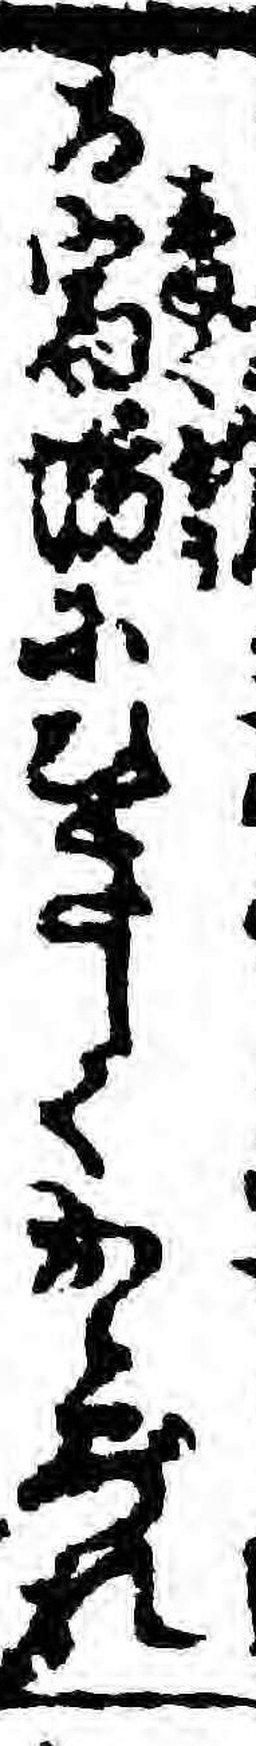る宿坊にひさしくおとづれ
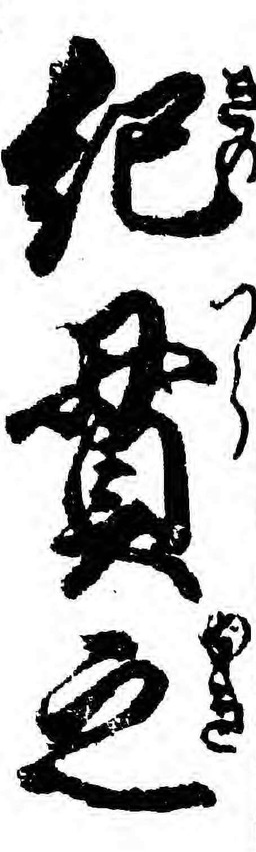紀貫之
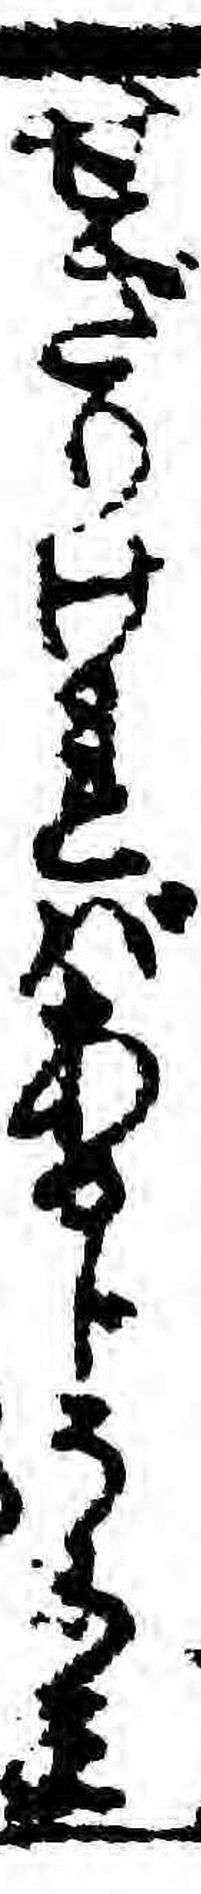せざりければあるじうらみ
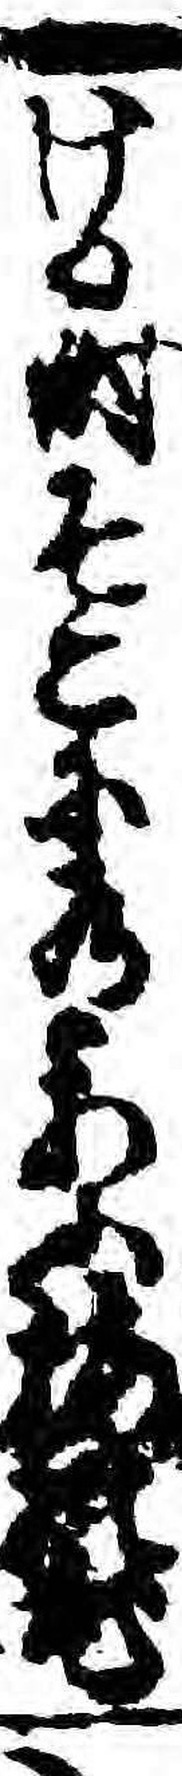ける時そこに有あふ梅の花
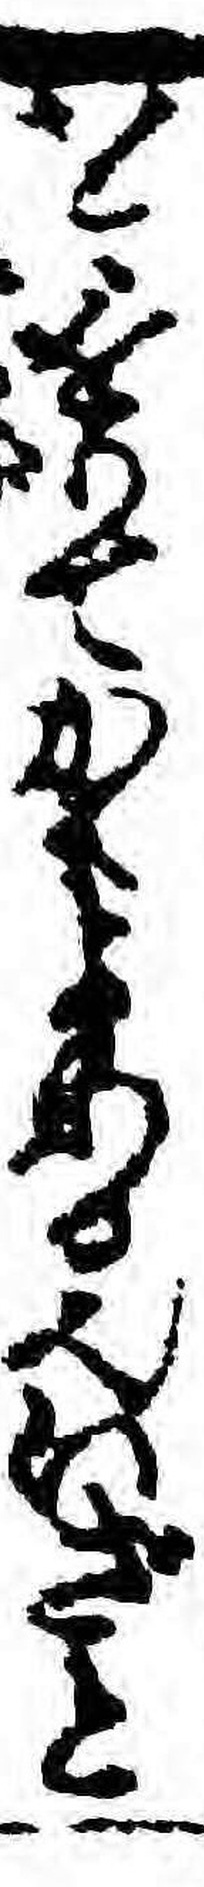ををりてかくよめる也いざと
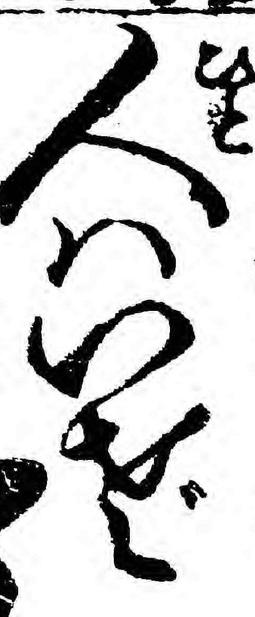人はいざ
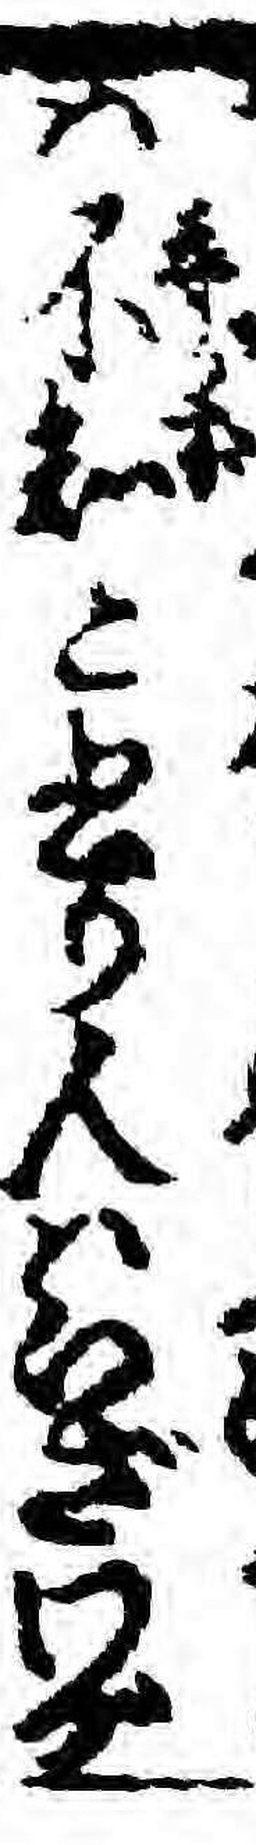は不知と書り人はいざわが
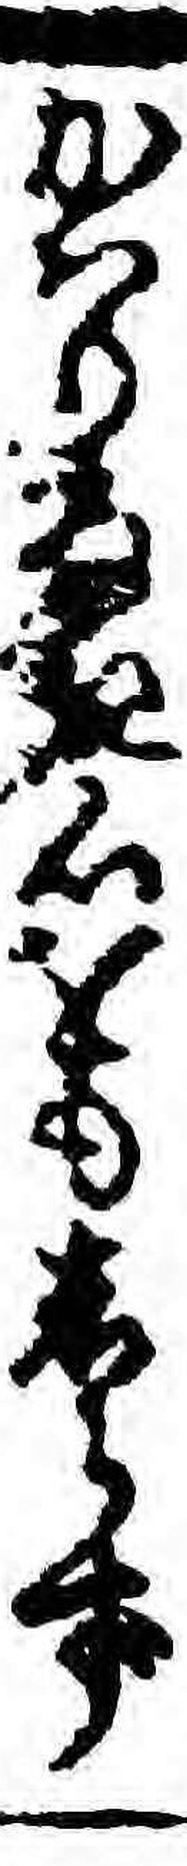かはりなき心をもしらず
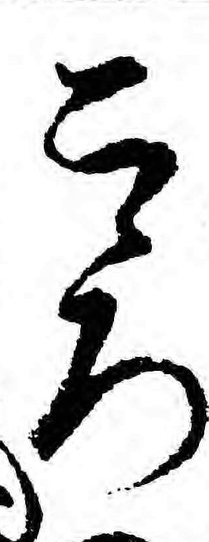こころ
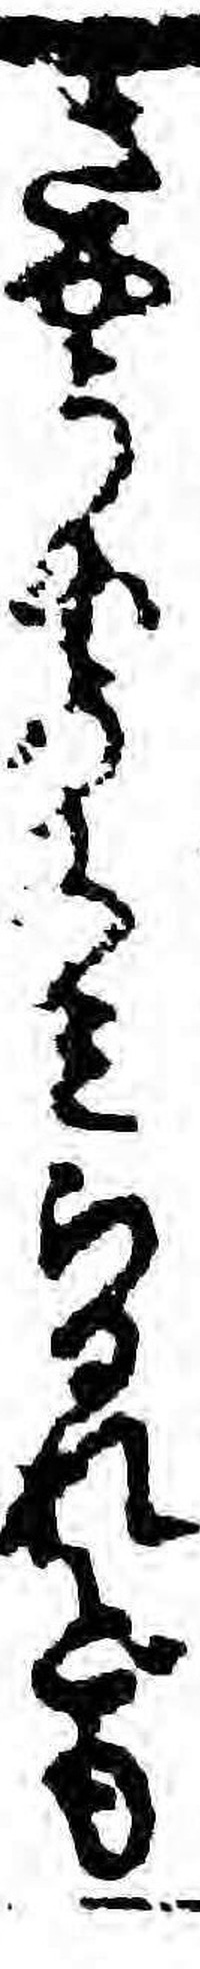さやうにうらみらるれども
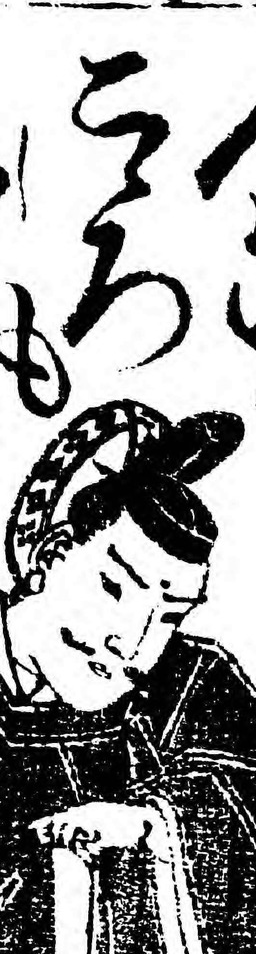こころ
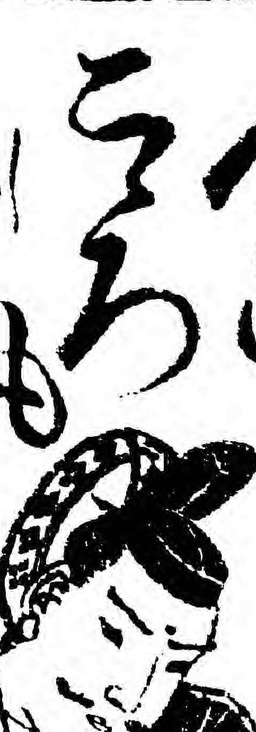こころ
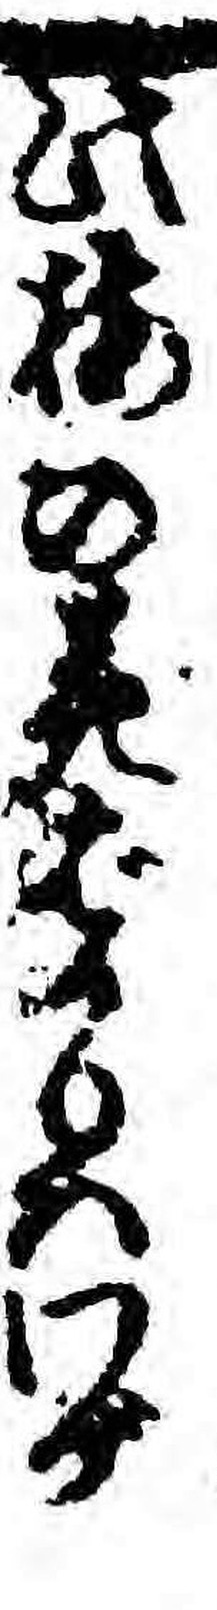此梅の花ばかりはわが
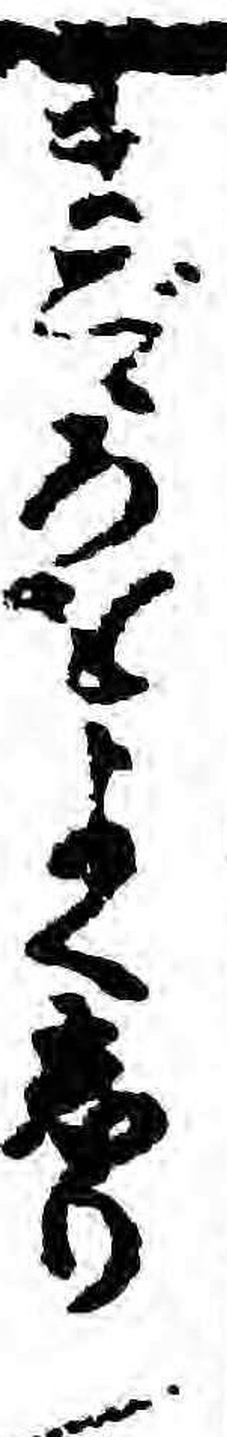まごゝろをよくしり
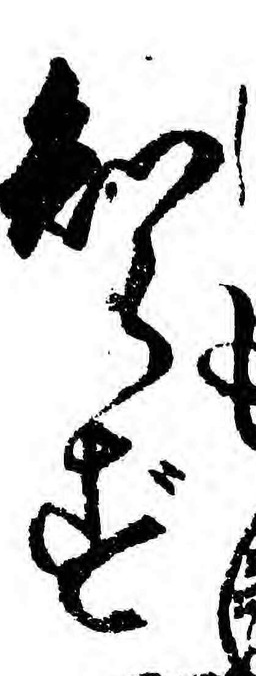知らず
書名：頭書和歌注譯／壽賀多百人一首小倉錦
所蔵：国文学研究資料館
